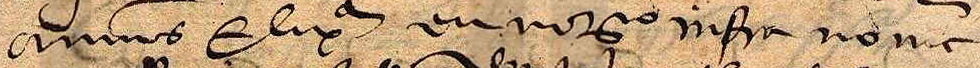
annos ē lixa eu notro infra nome
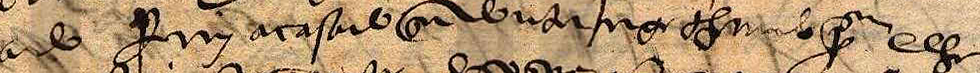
ado fuy a casa do s̄or doutor Jorge themudo ꝓsor e lhe
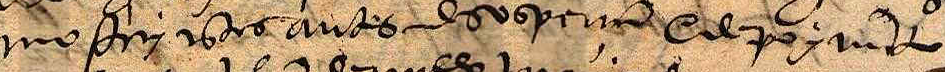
mostrey estes autos de sospeiçā e depoymēto
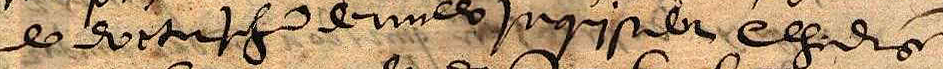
do doctor Johā de mello Jnqujsidor e lhe dise
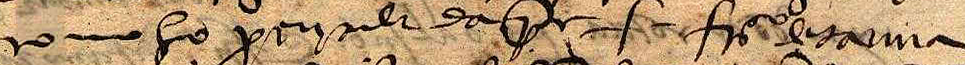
como ho ꝓcurador da p̄te .s. frrco de tauora
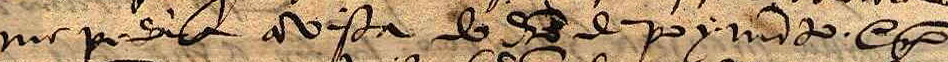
me pedia a vista do dtō depoymēto. e c̄ꝭ
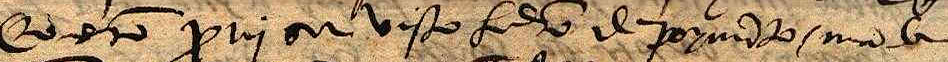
E o dtō ꝓujsor visto ho dtō depoymēto / mādou
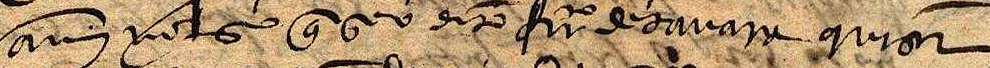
a mj̄ notro q̄ se o dito frrco de tauara quiser
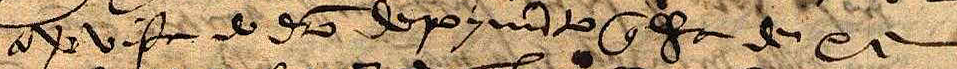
aꝟ vista do dtō depoymēto q̄ lha de e eu
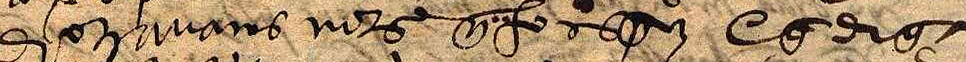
djo trauaços notro q̄ ho esp̄vj e q̄ diga
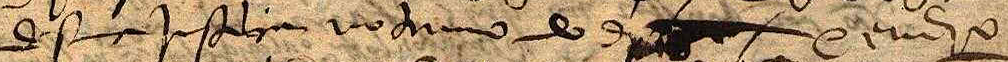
de sua Justiça no termo do dj_ / e eu djo
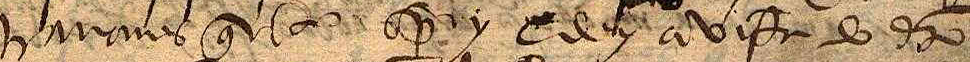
trauaços q̄ o sp̄vy e dey a vista do dto
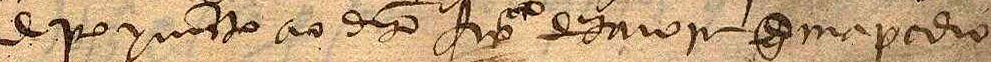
depoymēto ao dito frrco de tauora q̄ ma pedio
